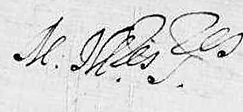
M. Ill.res S.res
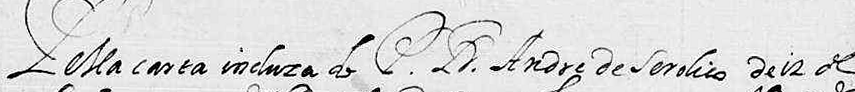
Pella carta incluza do P. Fr. Andre de Serolico de i2 de
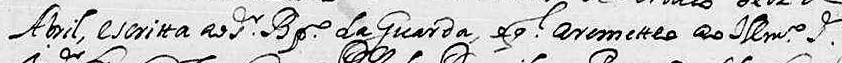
Abril, escritta ao sor. Bp.o da Guarda, o q.l a remetteo ao Illm.o Sor.
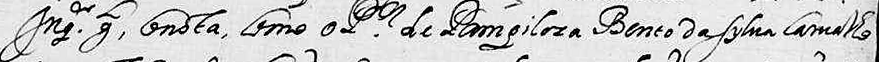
Jnq.or gl, consta, como o P.or de Pampiloza Bento da sylua Carualho
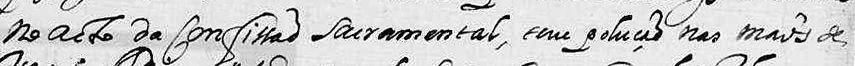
no acto da Confissaõ Sacramental, teue poluçaõ nas maõs de
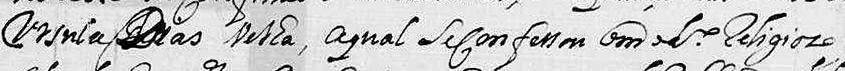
Vrsula Dias Velha, a qual Se Confessou com o d.o Religiozo
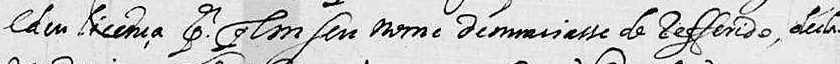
e deu licença p.a q̄ em seu nome denunciasse do Refferido, decla
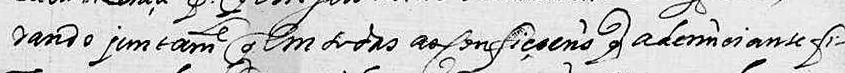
rando juntamte q̄ em todas as Confiçoen̄s q̄ a denūciante fi
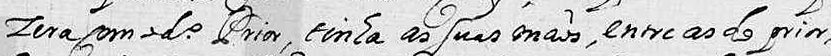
Zera com o d.o Prior, tinha as suas mãos, entre as do prior,
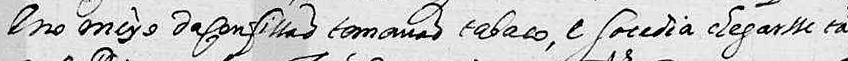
E no meyo da Confissaõ tomauão tabaco, e socedia chegarsse tā
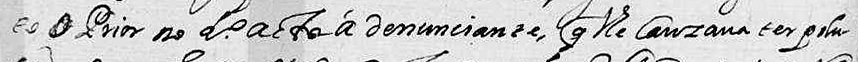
to o Prior no d.o acto á denunciante, q̄ lhe cauzaua ter polu
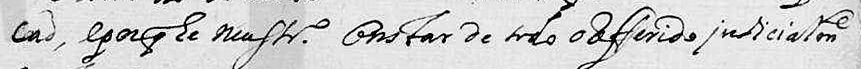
çaõ, e porq̄ he necessr.o constar de todo o Refferido judicialmte
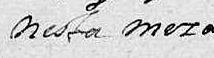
nesta meza,
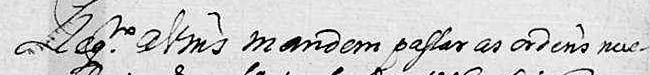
Req.ro a V ms̄ mandem passar as ordens nece
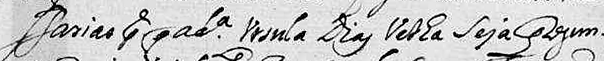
ssarias pa q̄ a d.a Vrsula Dias Velha seja progun
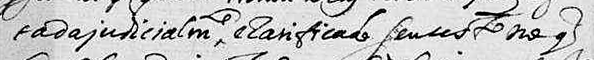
tada judicialmte, e Ratificado seu testo no q̄
